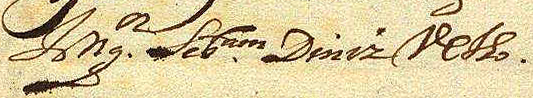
Inq.or Seb.am Diniz Velho.
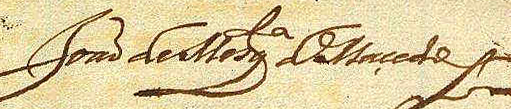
João de Mesq.ta de Macedo
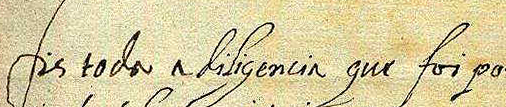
fis toda a diligencia que foi po
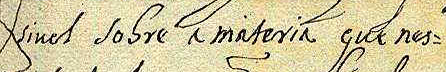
siuel sobre a materia que nes
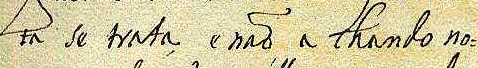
ta se trata, e naõ achando no
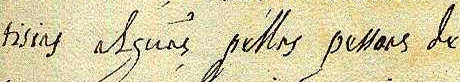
tisias alguās pellas pessoas de
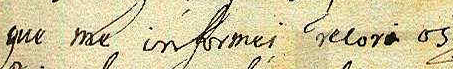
que me informei recori os
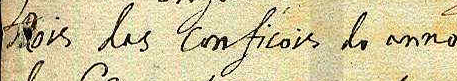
Rois das confiçois do anno
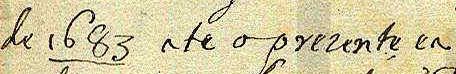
de 1683 ate o prezente, e a
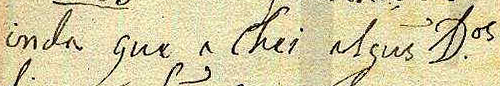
inda que achei algus̄ D.os
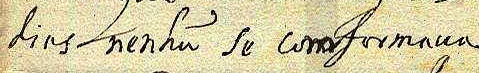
dias nenhū se comformaua
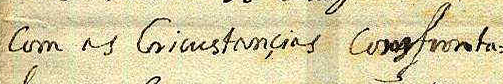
com as Cricustancias comfronta
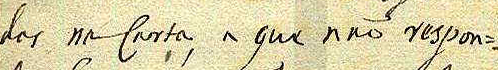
das na Carta, a que naõ respon
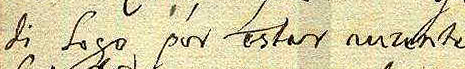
di logo por estar auzente
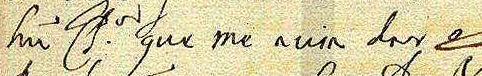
hū P.or que me auia dar e
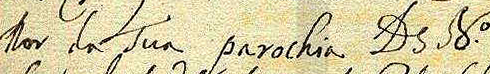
Ror da sua parochia Ds̄ N.o
